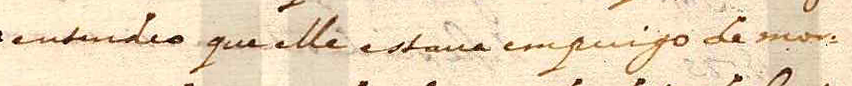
entendeo que elle estaua em perigo de mor
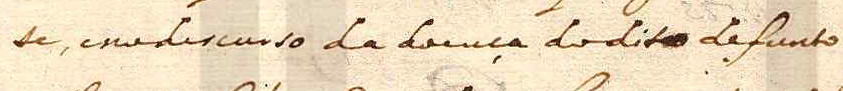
te, e no discurso da doença do dito defunto
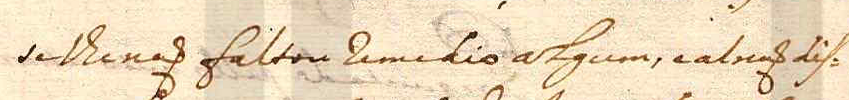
se lhe naõ faltou Remedio algum, e al naõ dis
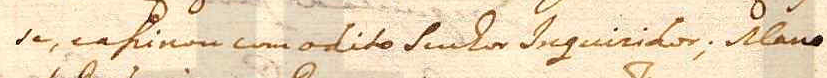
se e assinou com o dito Senhor Inquizidor; Mano
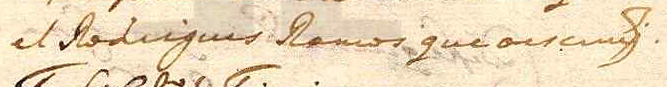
el Rodrigues Ramos que o escreuy.
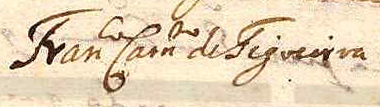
Franco Carnro de Figueiroa
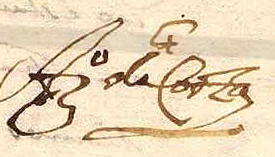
Ago da Costa
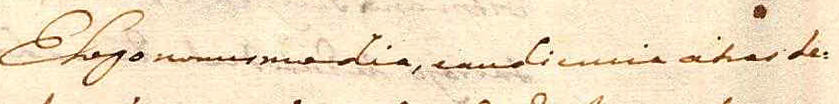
E logo no mesmo dia, e audiencia atras de
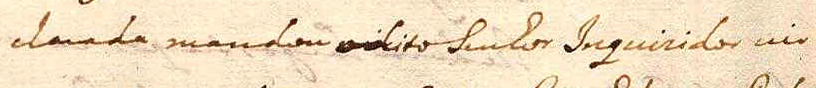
clarada mandou o dito Senhor Inquizidor uir
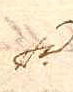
tt.a
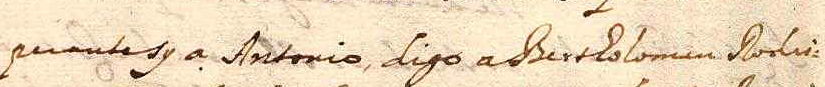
perante sy a Antonio, digo a Bertholomeu Rodri
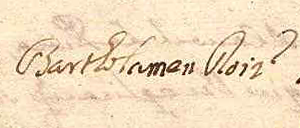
Bartholameu Roiz̄
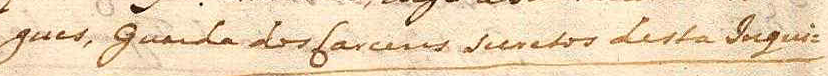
gues, Guarda dos Carceres secretos desta Inqui
